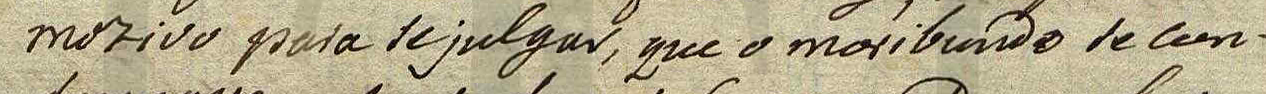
motivo para se julgar, que o moribundo se cun
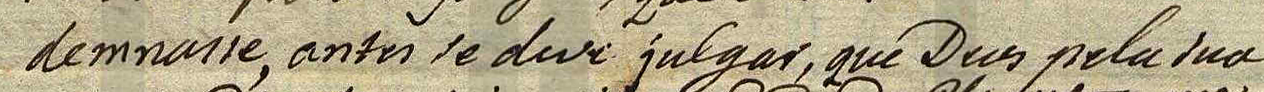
demnasse, antes se deve julgar, que Deos pela sua
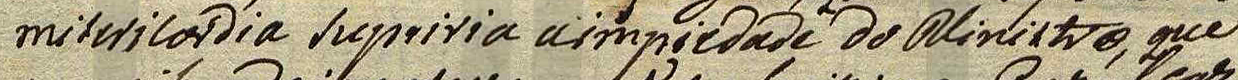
misericordia supriria a impiedade do Ministro, que
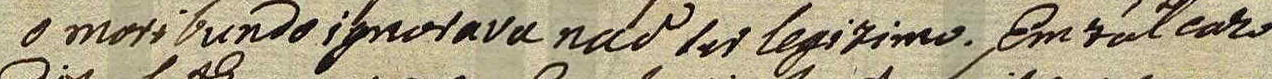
o moribundo ignorava naõ ser legitimo. Em tal cazo
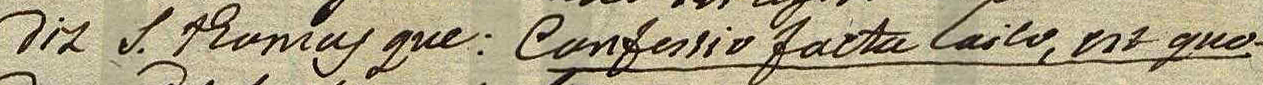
diz S. thomas que: Confessio facta laico est quo
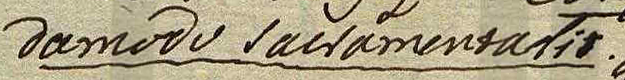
da modo sacramentalis.
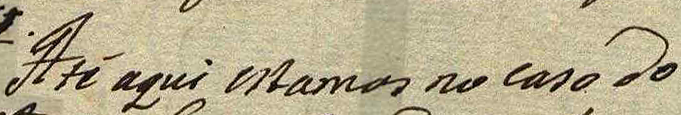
Até aqui estamos no caso do
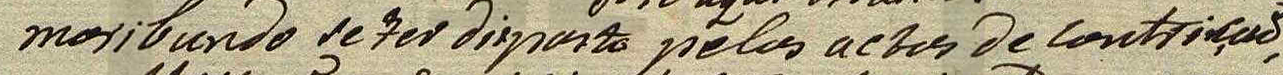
moribundo se ter disposto pelos actos de contriçaõ,
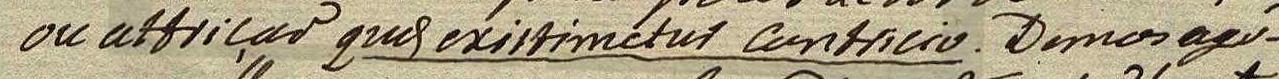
ou attriçaõ quæ existimetur contricio. Damos ago
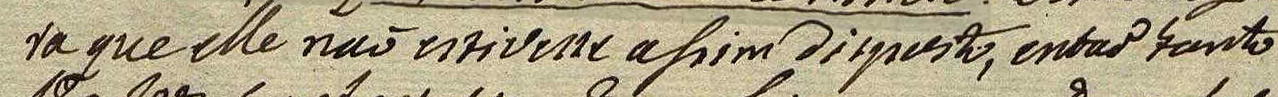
ra que elle naõ estivesse assim disposto, entaõ tanto
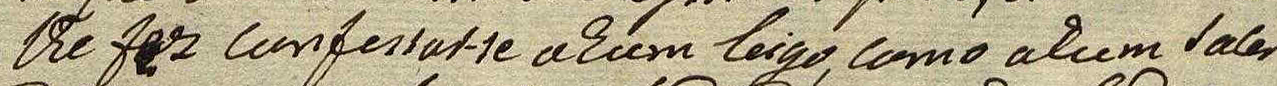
lhe fez confessar-se a hum leigo, como a hum saCer
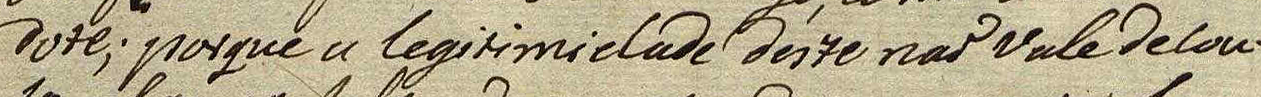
dote; porque a legitimidade deste naõ vale de cou
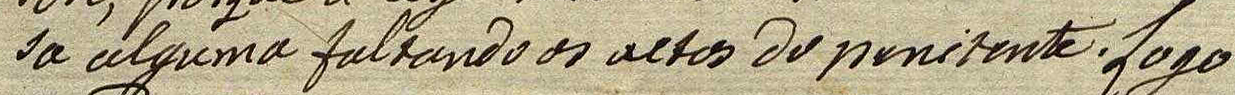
sa alguma faltando os actos do penitente. Logo
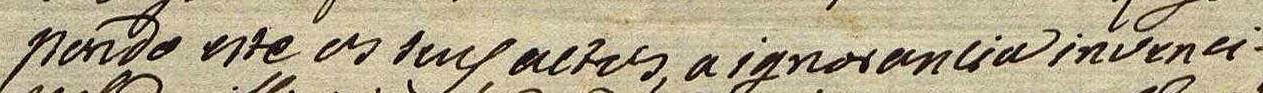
pondo este os seus actos, a ignorancia invenci
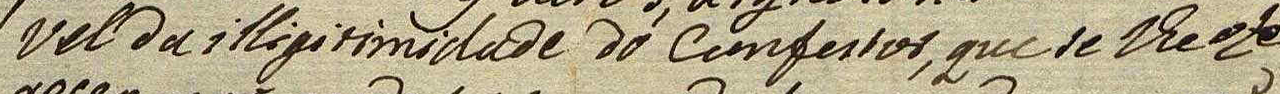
vel da illigitimidade do Confessor, que se lhe ofe
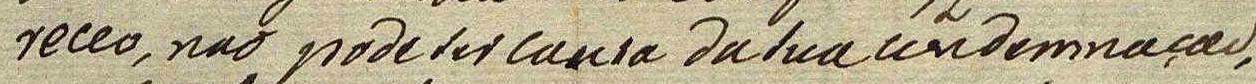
receo, naõ pode ser causa da sua condemnaçaõ,
